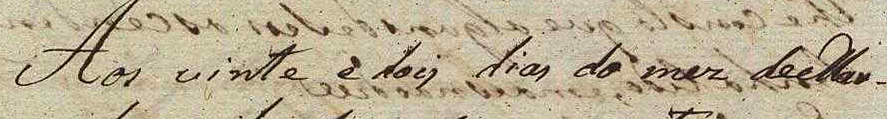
Aos vinte e dois dias do mez de Mar
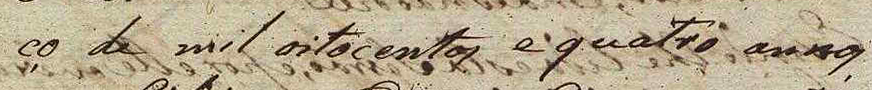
ço de mil oitocentos e quatro annos
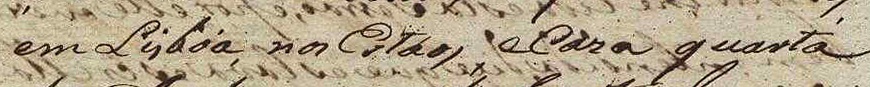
em Lisboa nos Estaos, e Caza quarta
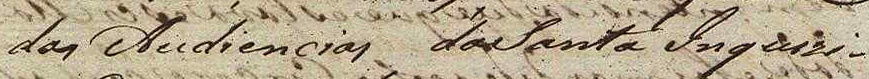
das Audiencias da Santa Inquizi
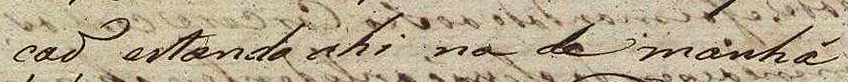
çaõ, estando ahi na de manhã
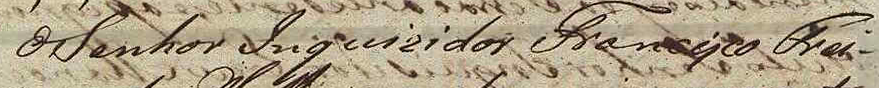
o Senhor Inquizidor Francisco Frei
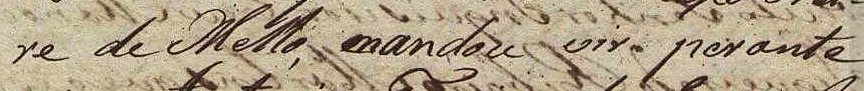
re de Mello, mandou vir perante
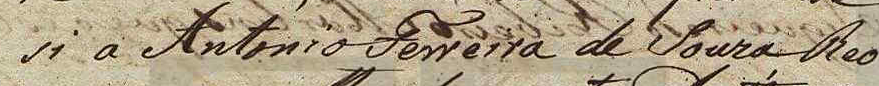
si a Antonio Ferreira de Souza Reo
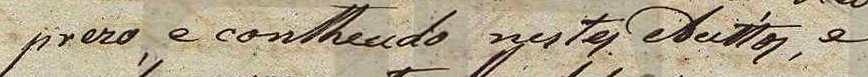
prezo, e contheudo nestes Auttos, e
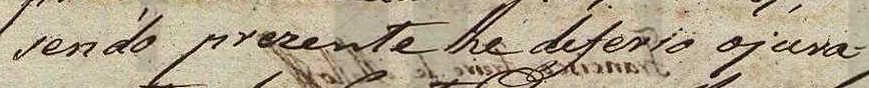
sendo prezente he deferio o jura
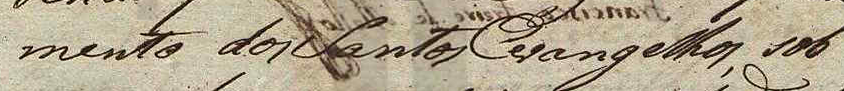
mento dos Santos Evangelhos, sob
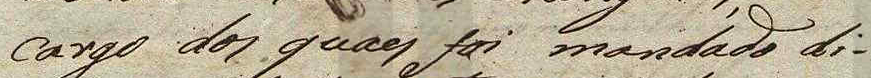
cargo dos quaes foi mandado di
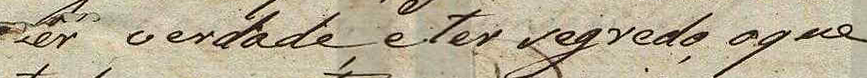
zer verdade, e ter segredo, o que
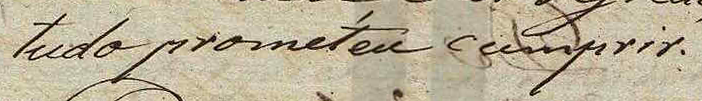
tudo prometeu cumprir.
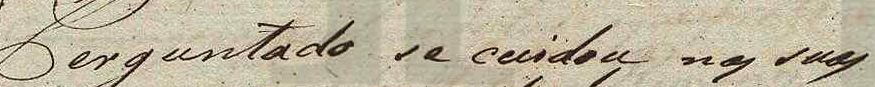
Perguntado se cuidou nas suas
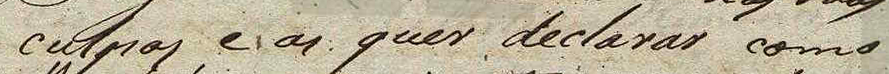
culpas, e as quer declarar como
